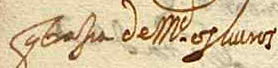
q̄ trazia de Md. os liuros
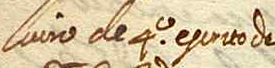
liuro de 4.o escrito de
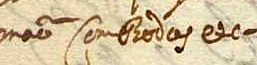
maõ Com Rodas &c-
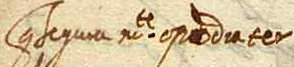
q̄ seguramte. o podia ter
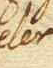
e ler
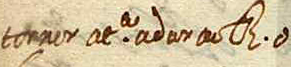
tornor a ta. a dar ao R. o
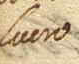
liuro
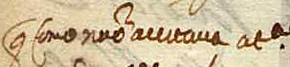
q̄ Como naõ aceitaua a ta.
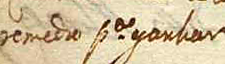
remedio p.a ganhar
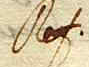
Ref.
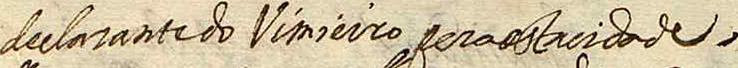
declarante do Vimieiro pera esta cidade,
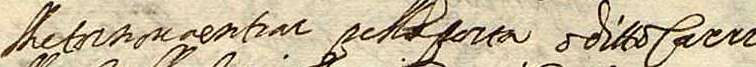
lhe tornou a entrar pella porta o ditto Carri
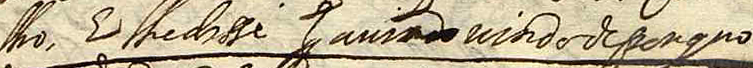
lho, E lhe disse q̄ auiado uindo de pouquo
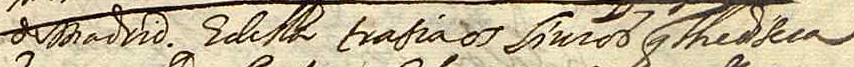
de madrid. E della trasia os Liuros q̄ lhe disera
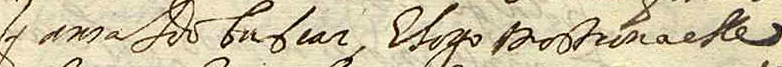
q̄ auia Ido buscar, E logo mostrou a elle
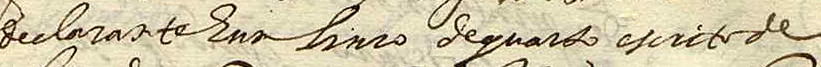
declarante hum Liuro de quarto escrito de
